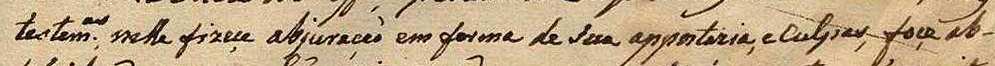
testem.as, nelle fizece abjuraçaõ em forma de sua appostazia, e culpas, foce ab
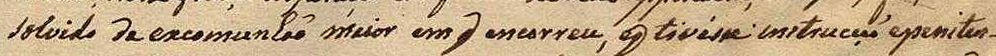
solvido da excomunhaõ maior em q̄ encorreu, e q̄ tivesse instrucçaõ e peniten
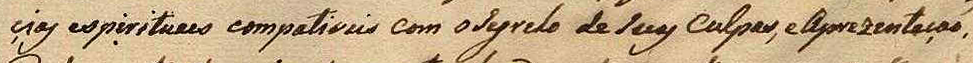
cias espirituaes compativeis com o segredo de suas culpas, e aprezentaçaõ,
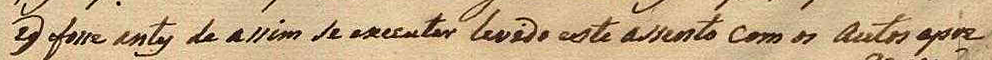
e q̄ fosse antes de assim se executar levado este assento com os autos a pre
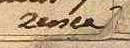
zença
